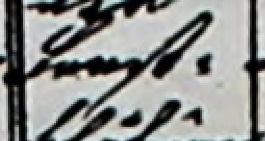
Forst„
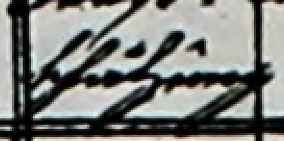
schätzung
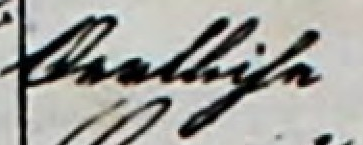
Vertliche
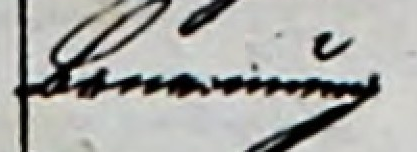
Benennung
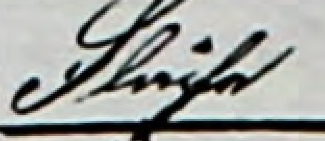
Fläche
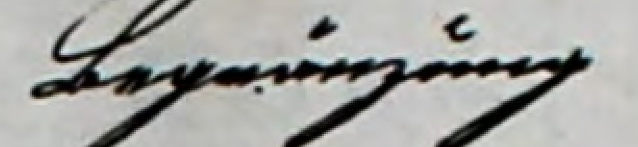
Begränzung
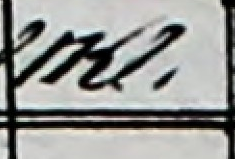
Kl.
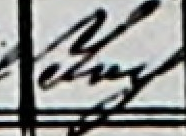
Joch
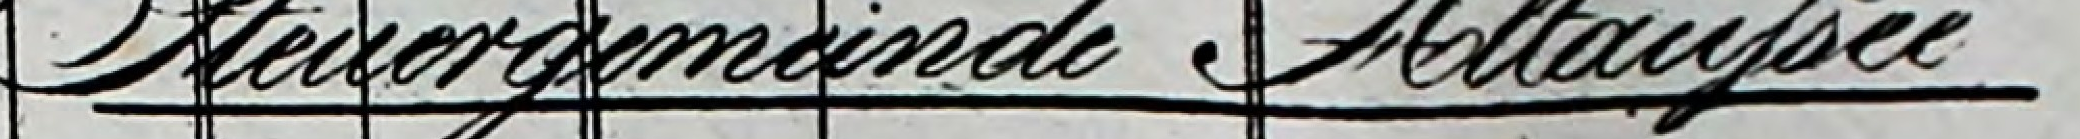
Steuergemeinde Altaussee
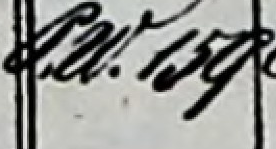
P.W. 159
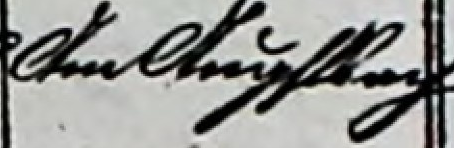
Am Augflbach
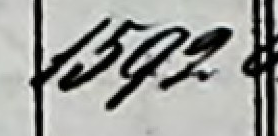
1592
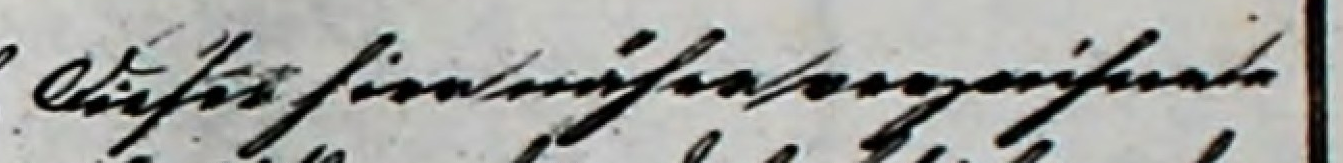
Dieser hier näher verzeichnete
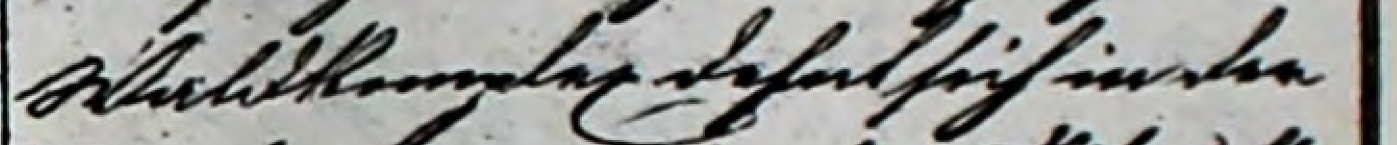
Waldkomplex dehnt sich in der
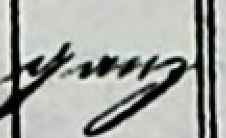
ganz
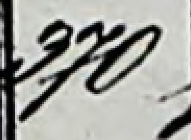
370
